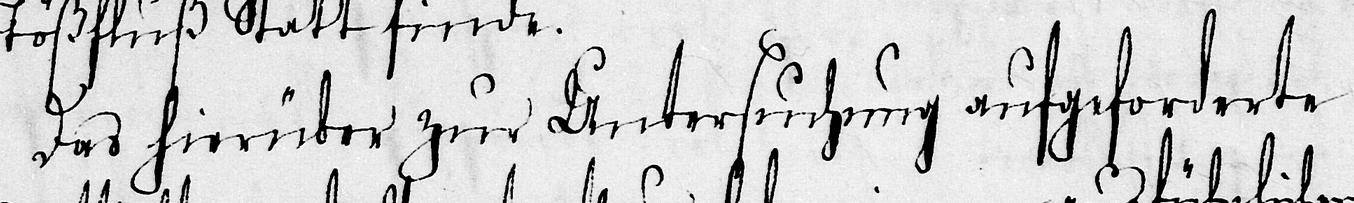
Das hierüber zur Untersuchung aufgeforderte
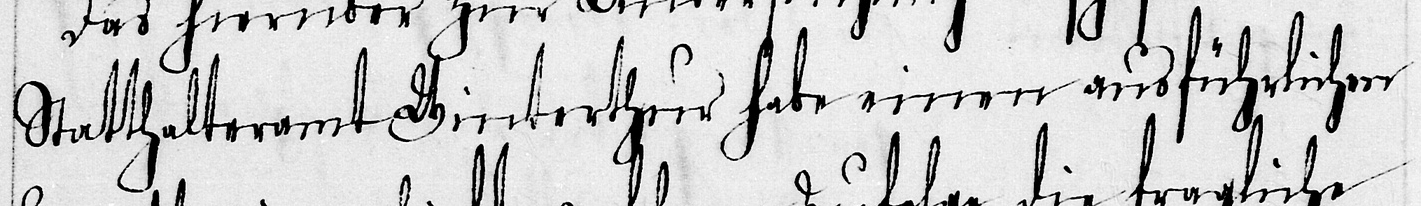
Statthalteramt Winterthur habe einen ausführlichen
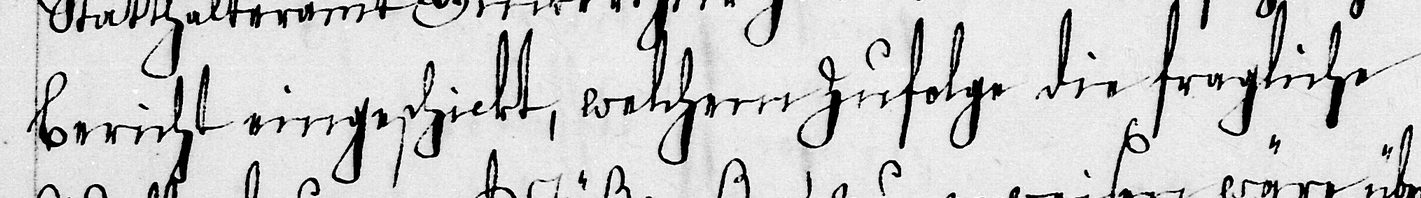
Bericht eingeschickt, welchem Zufolge die fragliche
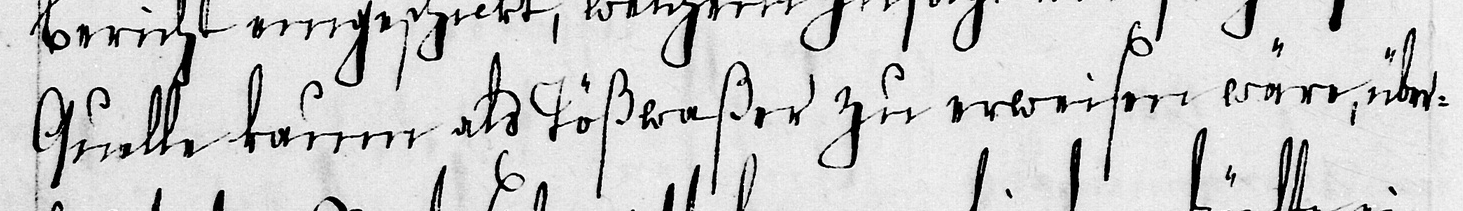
Quelle kaum als Tößwaßer zu erweisen wäre, über¬
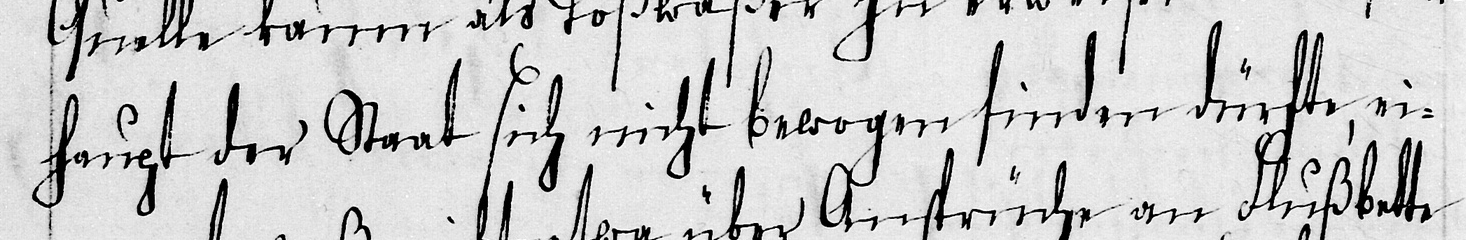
haupt der Staat sich nicht bewogen finden dürfte, ei¬
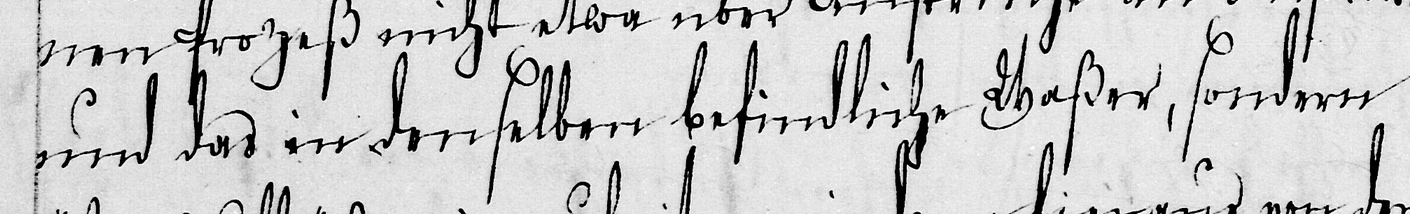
und das in denselben befindliche Waßer, sondern
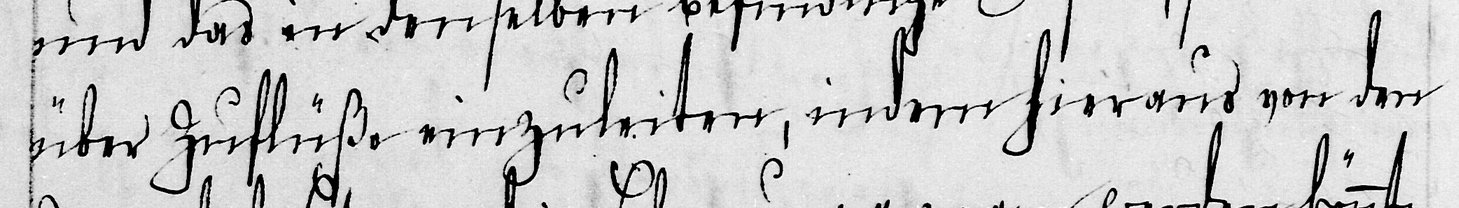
über Zuflüße einzuleiten, indem hieraus von den
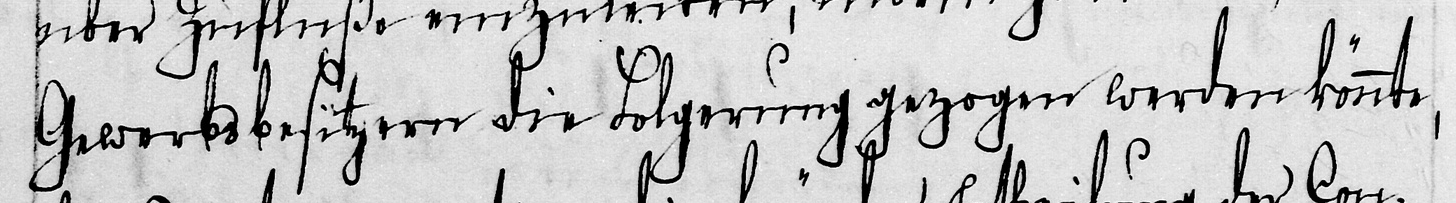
Gewerbsbesitzern die Folgerung gezogen werden könnte,
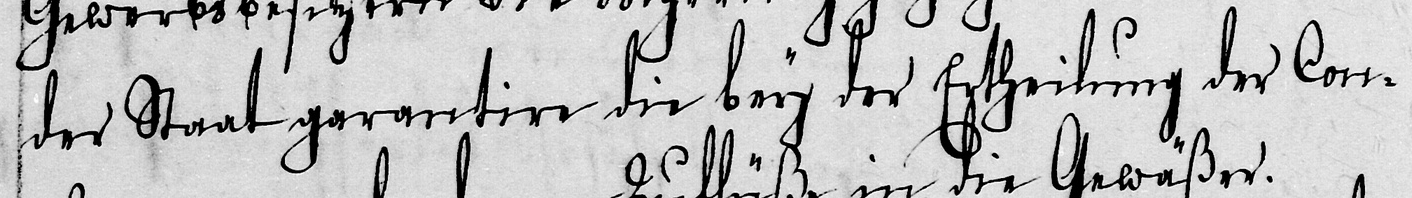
der Staat garantire die bey der Ertheilung der Con¬
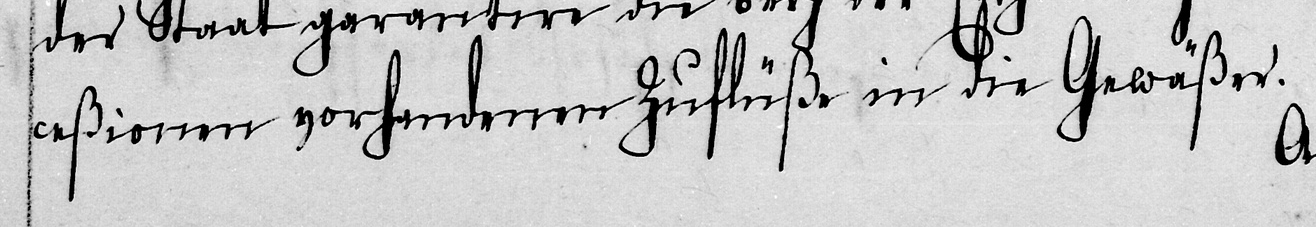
ceßionen vorhandenen Zuflüße in die Gewäßer.
